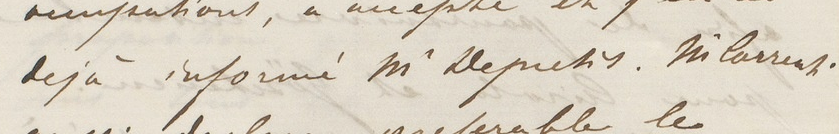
dejà informé MrDepretis. MrCorrenti
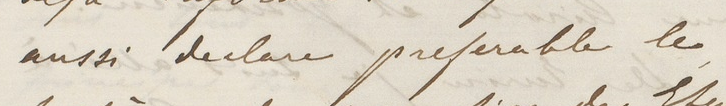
aussi declare preferable les
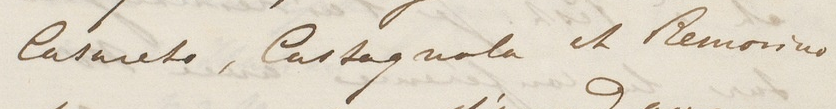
Casareto, Castagnola et Remorino
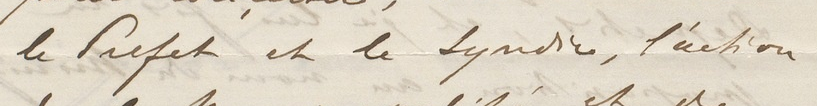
le Prefet et le Syndic, l'action
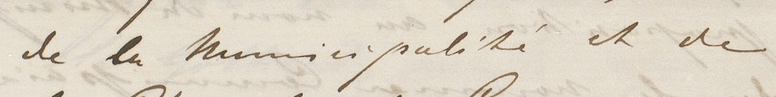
de la Municipalité et de
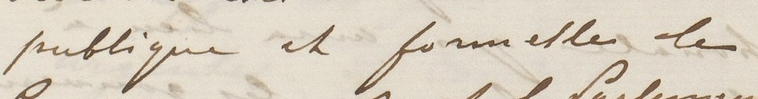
publique et formelle le
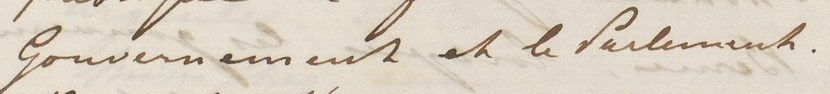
Gouvernement et le Parlement.
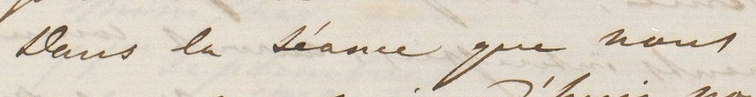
Dans la séance que nous
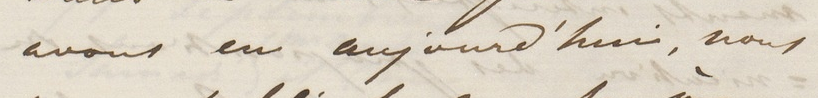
avons eu aujourd'hui, nous
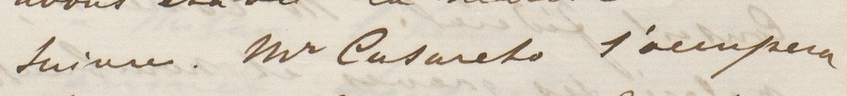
suivre. MrCasareto s'occupera
